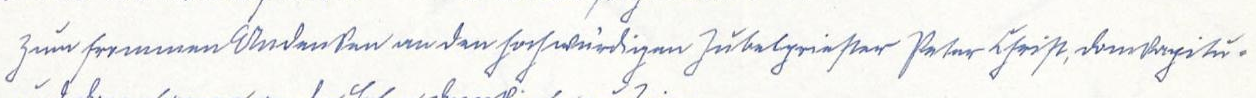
Zum frommen Andenken an den hochwürdigen Jubelpriester Peter Christ, Domkapitu-
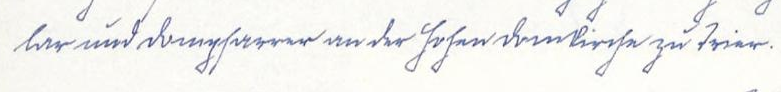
ar und Dompfarrer an der hohen Domkirche zu Trier.
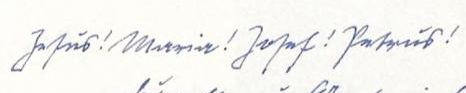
Jesus! Maria! Josef! Petrus!
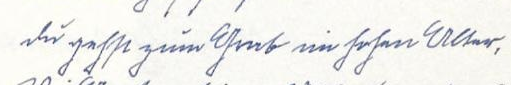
Du gehst zum Grab im hohen Alter,
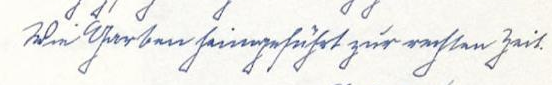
Wie Garben heimgeführt zur rechten Zeit.
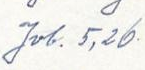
Job. 5,26
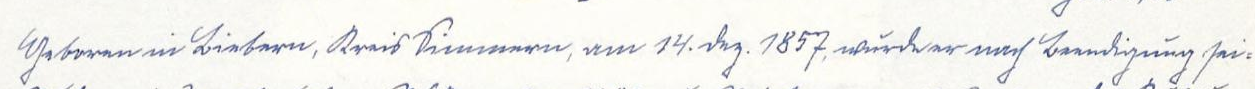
Geboren in Biebern, Kreis Simmern, am 14. Dez. 1857, wurde er nach Beendigung sein-
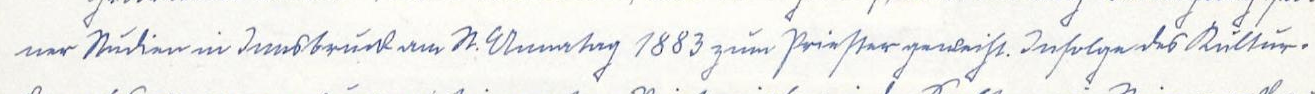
ner Studien in Innsbruck am St. Annatag 1883 zum Priester geweiht. Infolge des Kultur-
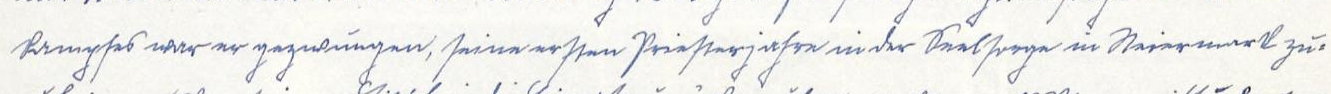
kampfes war er gezwungen, seine ersten Priesterjahre in der Seelsorge in Steiermark zu-
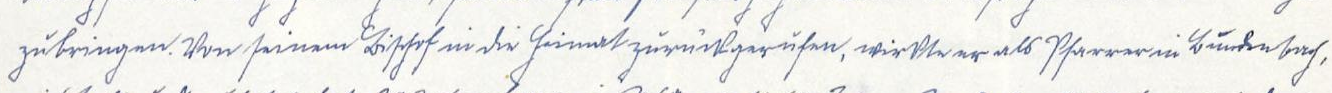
zubringen. Von seinem Bischof in die Heimat zurückgerufen, wirkte er als Pfarrer in Bundenbach,
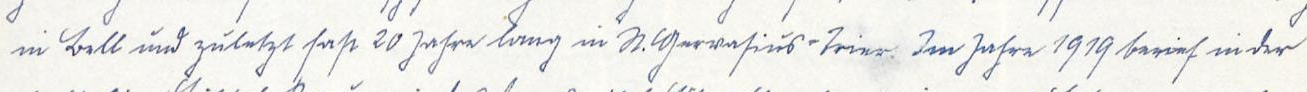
in Bell und zuletzt hast 20 Jahre lang in St. Gervesius - Trier. Im Jahre 1919 berief in der
